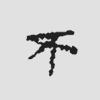不
